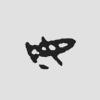母
